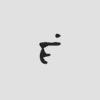可
